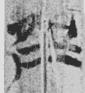○（强）
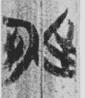門
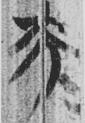大夫
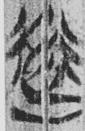○（率）
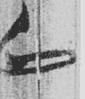㠯（以）
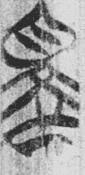睪（釋）
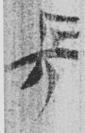長
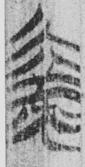魚
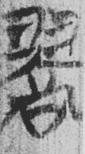翯（矯）
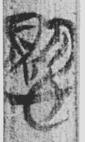惻（賊）
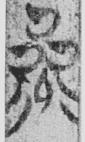參（三）
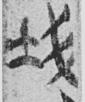郤郤
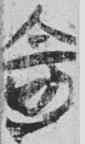奇
